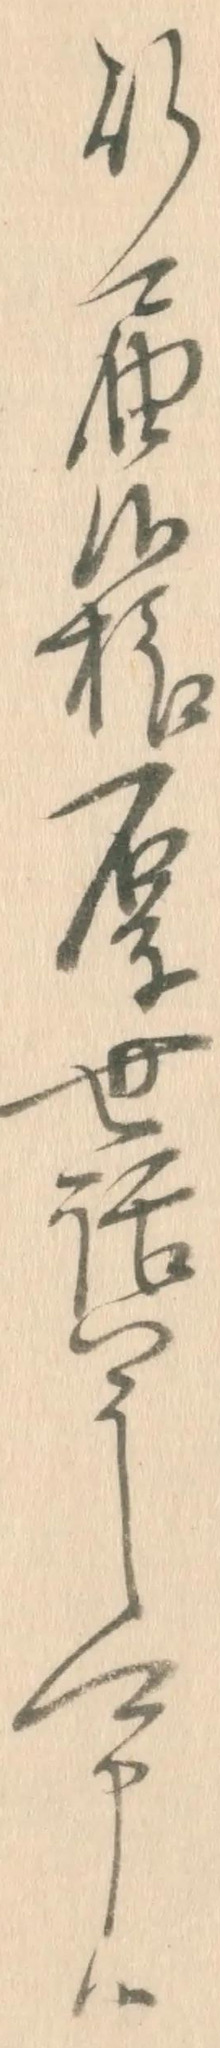行届候様厚世話いたし可申候
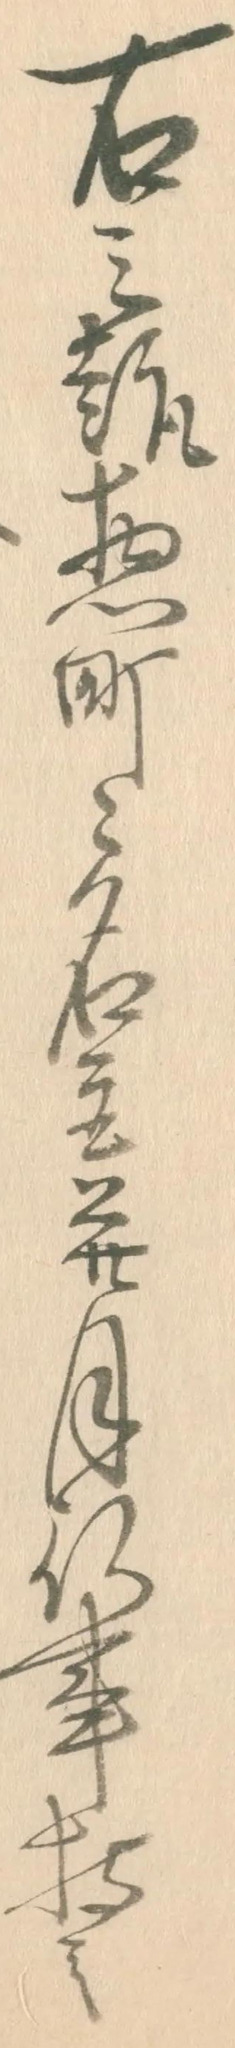右之趣惣町々名主并月行事持之
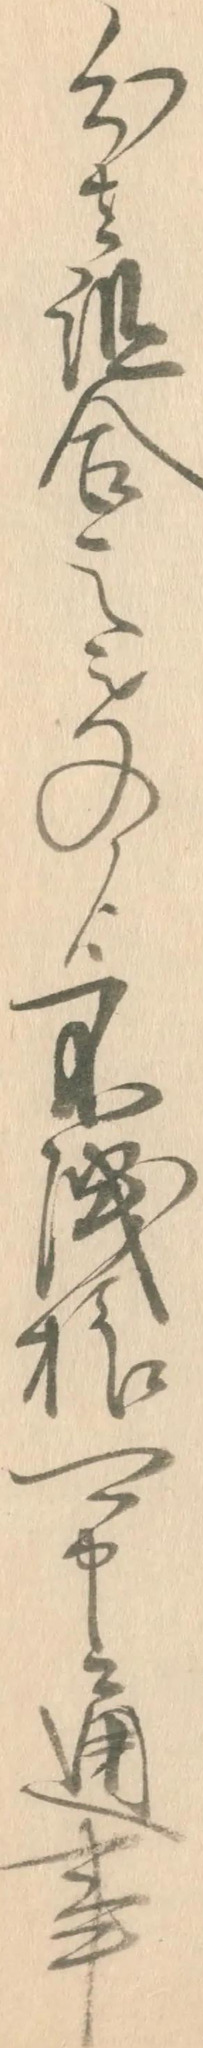分は組合之ものゟ不洩様可申通事
